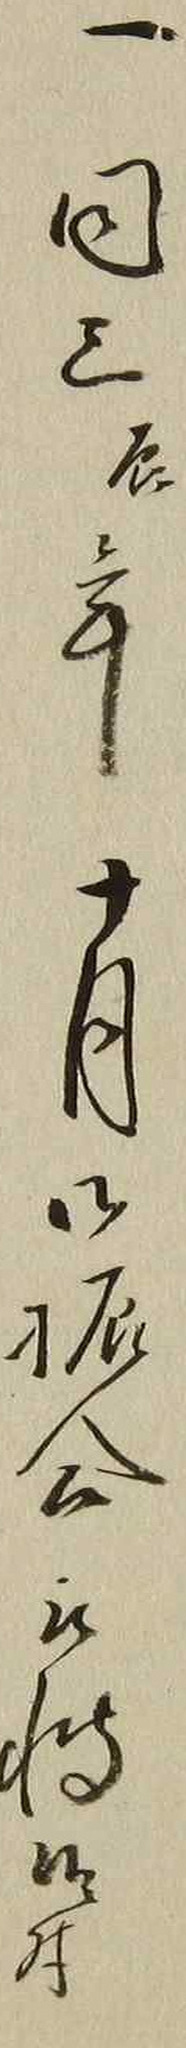一同三辰年十月御振合被転候ニ付
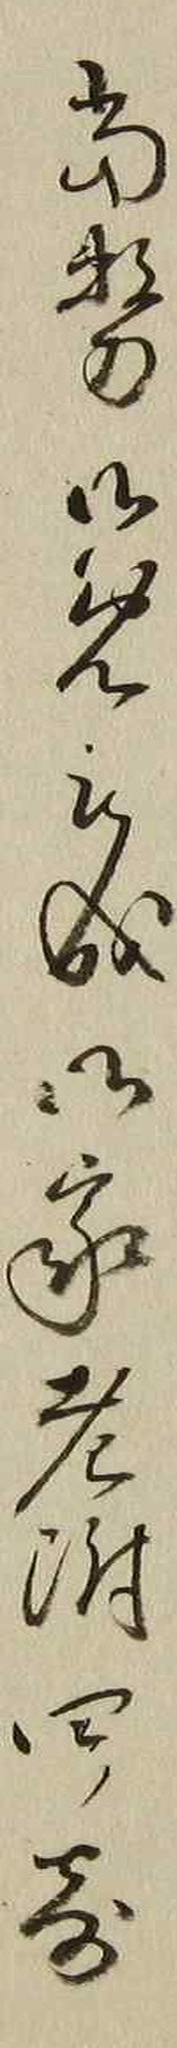当務御免被成御家老附四ノ寄
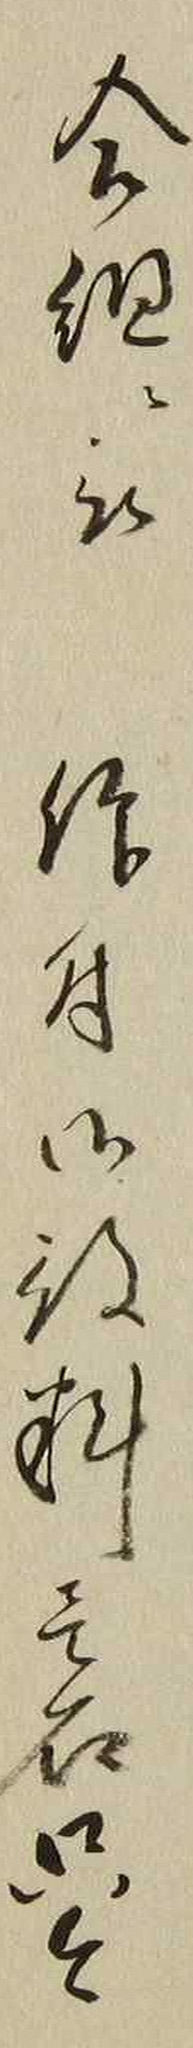合組ニ被仰付御役料壱石只今
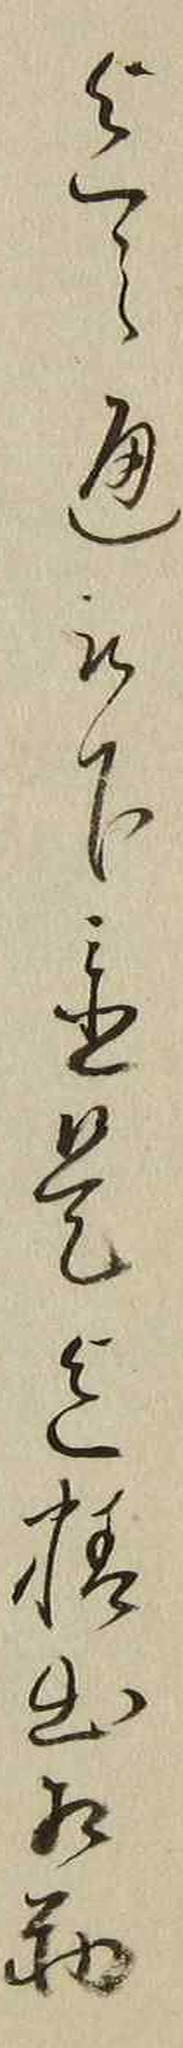迄之通被下置是迄精出相勤
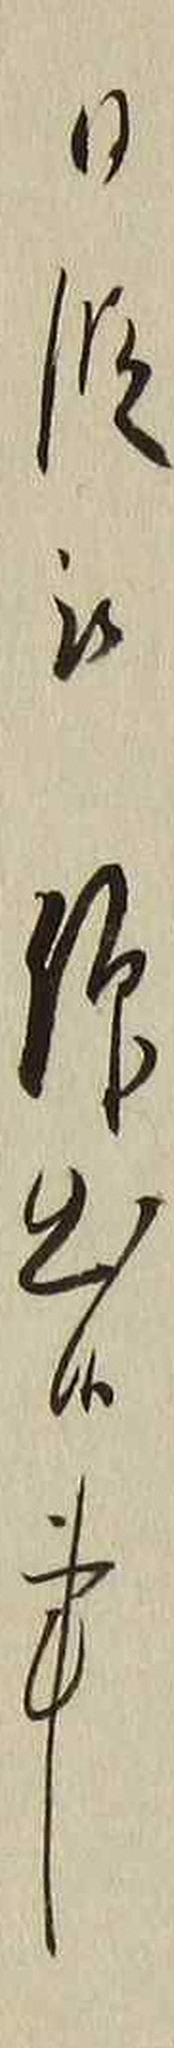候段被仰出候事
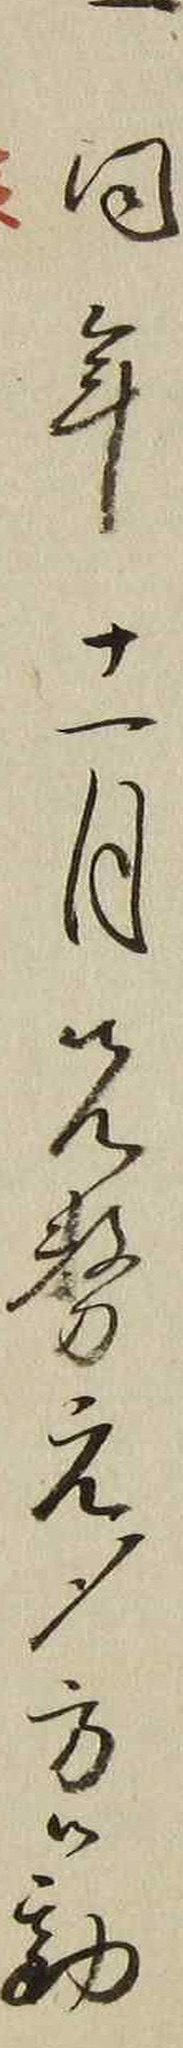一同年十一月先務元〆方御勘
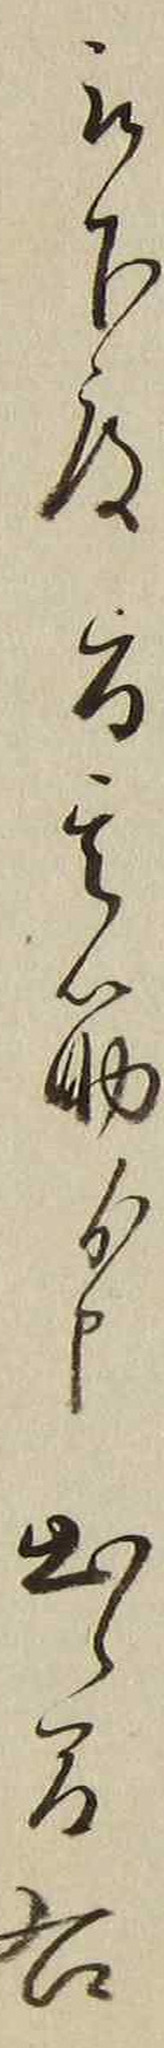被下度旨其筋ゟ申出候間右
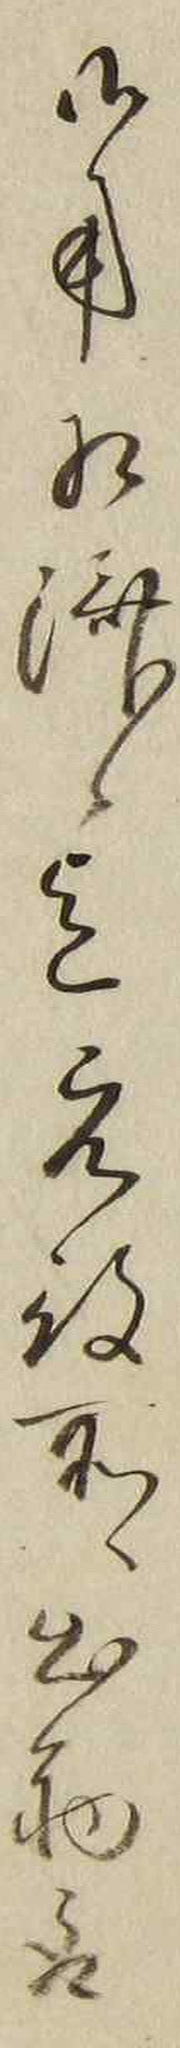御用相済候迄元役所へ出金取
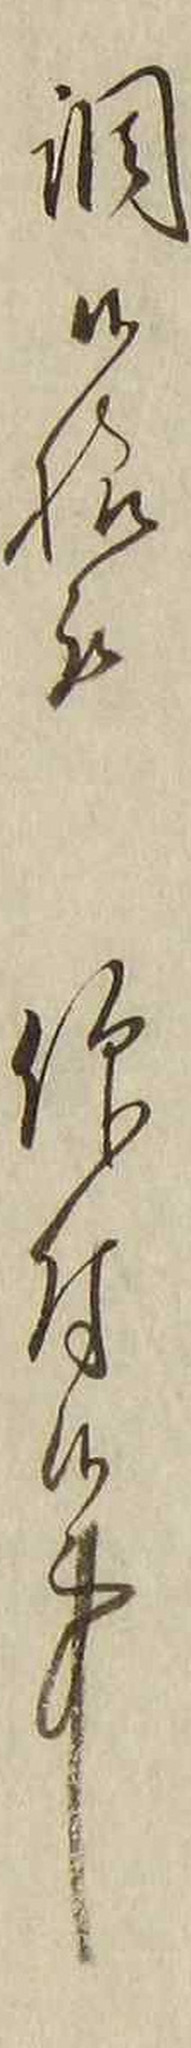調候様被仰付候事

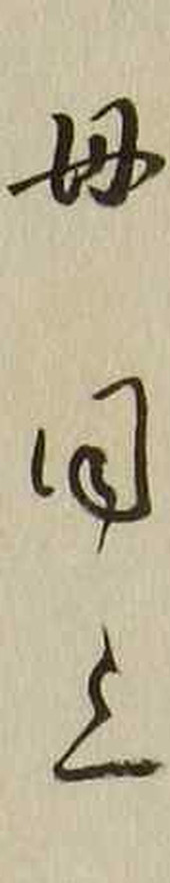母同上
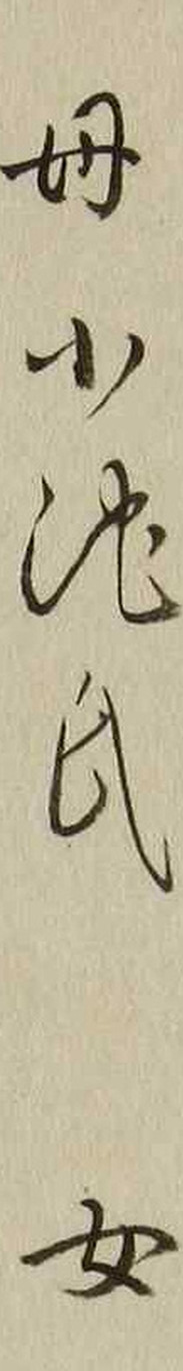母小池氏女
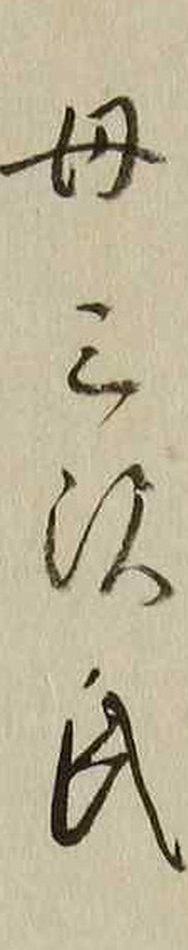母三沢氏
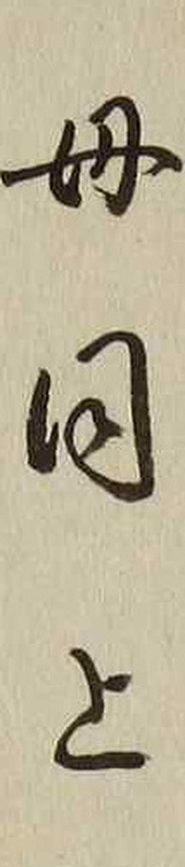母同上
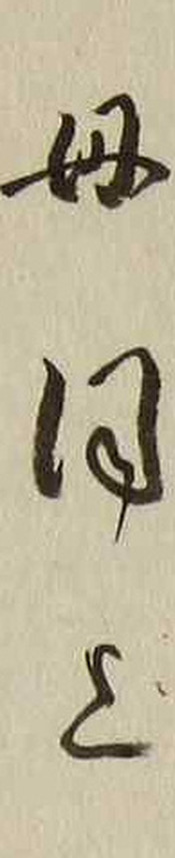母同上
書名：諸士系譜　巻之132　た之部8
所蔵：会津若松市立会津図書館
